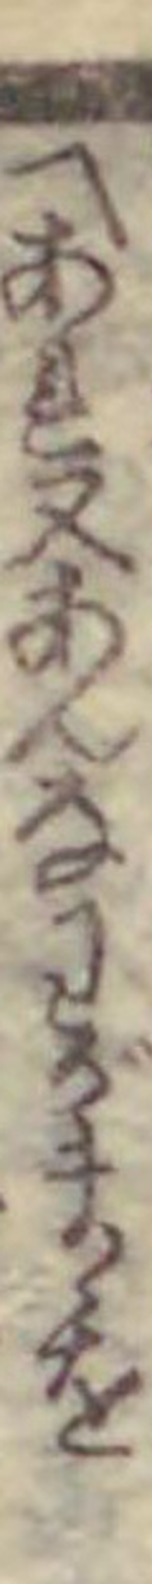〽あれ又あんなわがまゝを
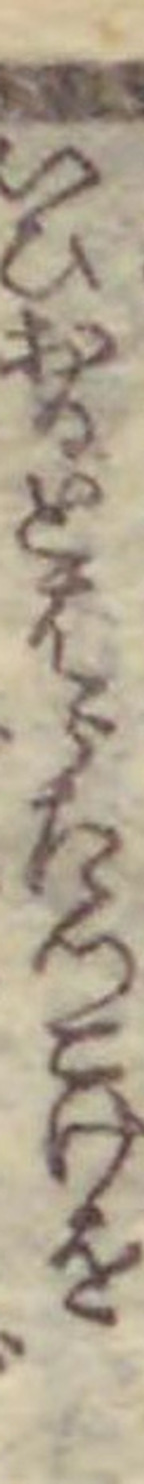いひおるとはらたつこけを
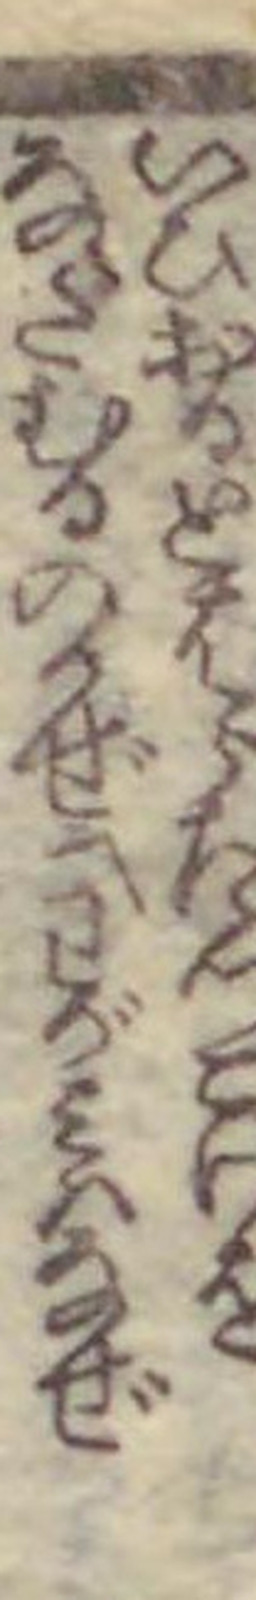なだむるのかぜ〽わがみはなぜ
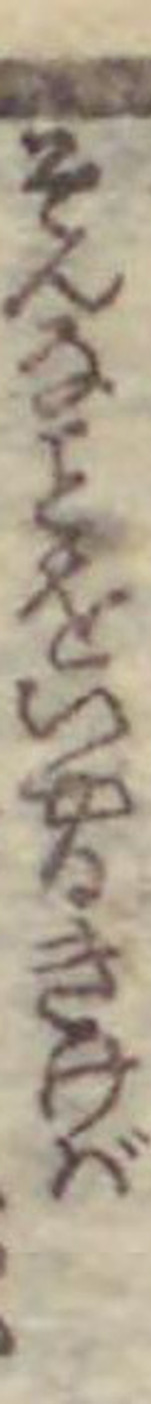そんなことをいやるきけば
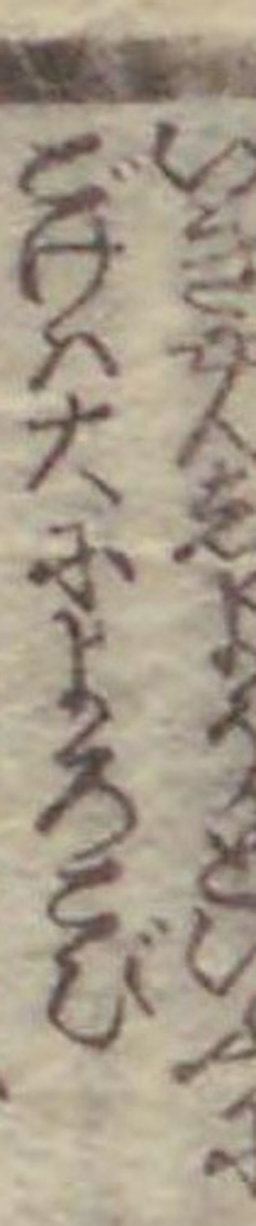ごけは大によろこび
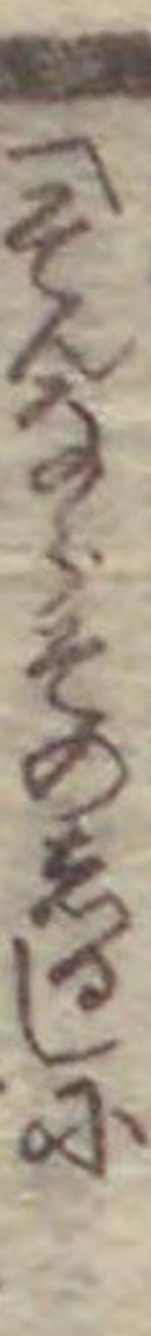〽そんならそのしるしに
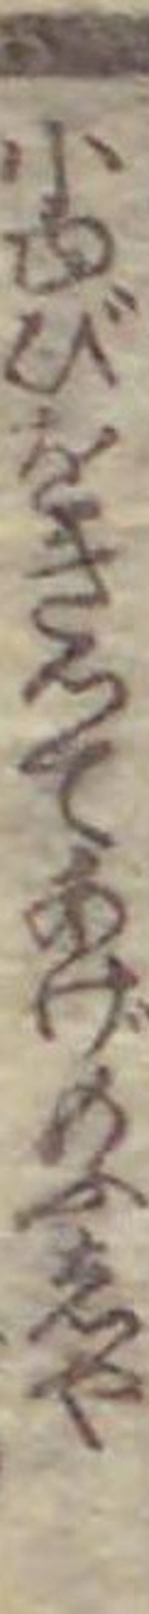小ゆびをきつてあげもふしや
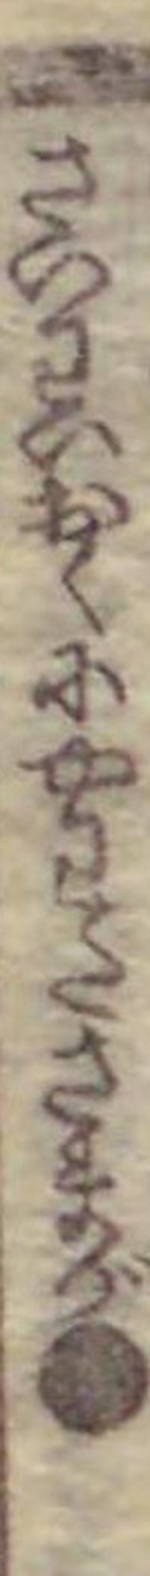さいわいおくにやわたさまが●

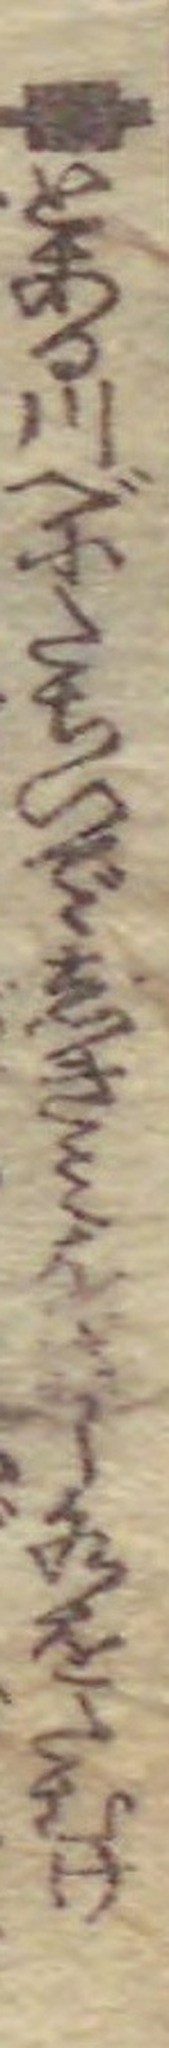※とある川べにたちいでゝしきみをさし水をたむけ
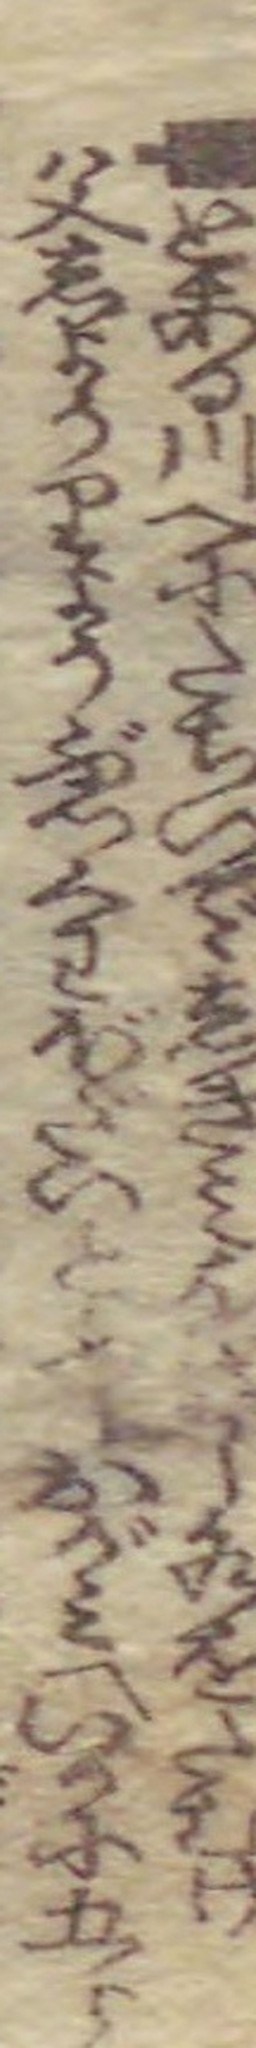父しようりようぶつくわぼだいとふしおがみ〽いかに五郎
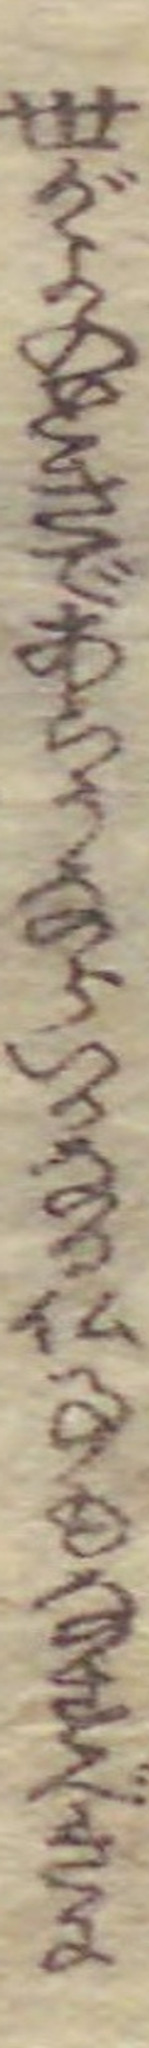世がよのときであらうならいかなる仏事もなすべきに
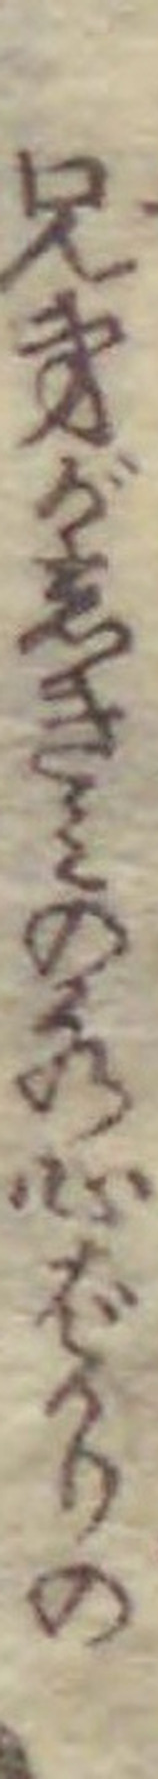兄弟がしきみの水心ばかりの
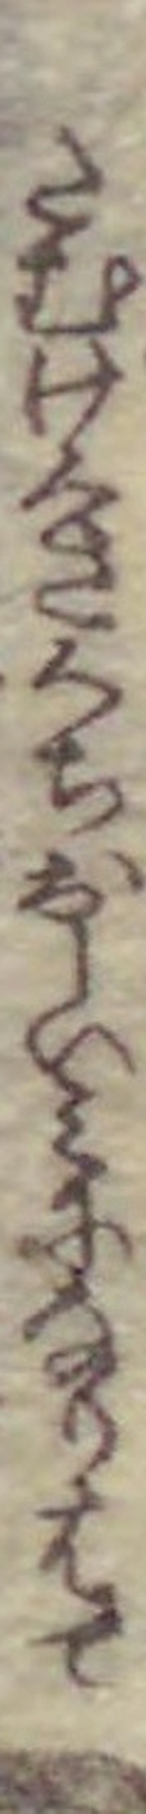たむけくさくちおしいみになりはて
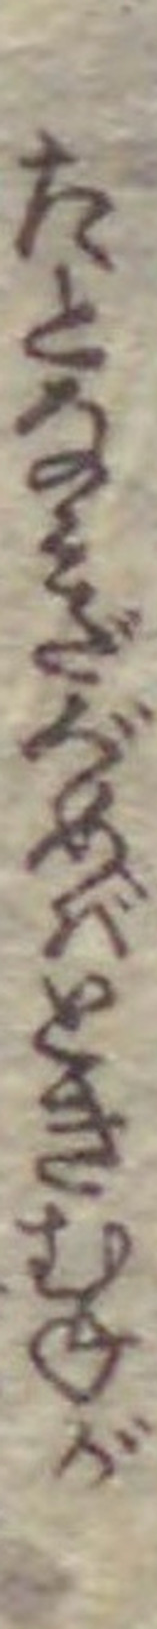たとなみだぐめばときむねが
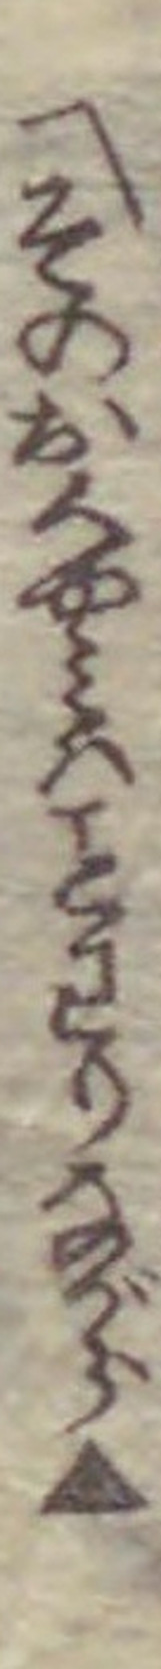〽そのおくやみはことわりながら▲
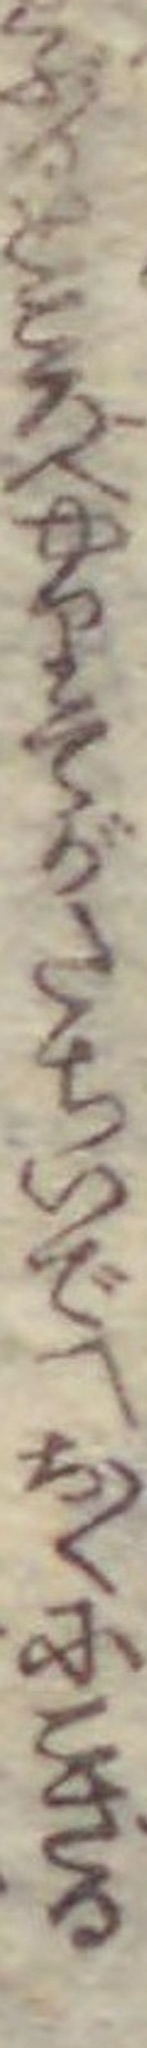わぶるところへやりてがたちいで〽おくにござる
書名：大時代唐土化物 3巻. 曽我太夫染
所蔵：国立国会図書館 National Diet Library, JAPAN
